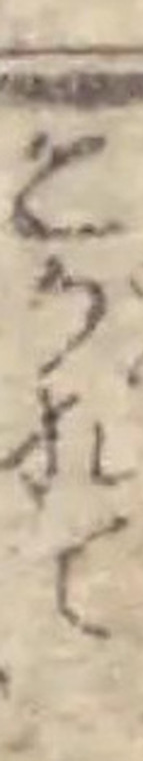こがれて
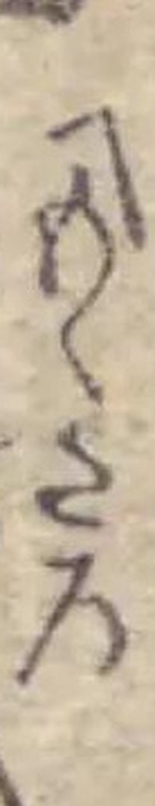〽もゝたろ
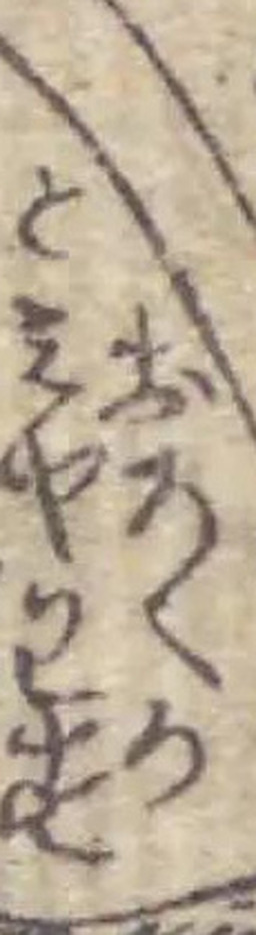とみやわす
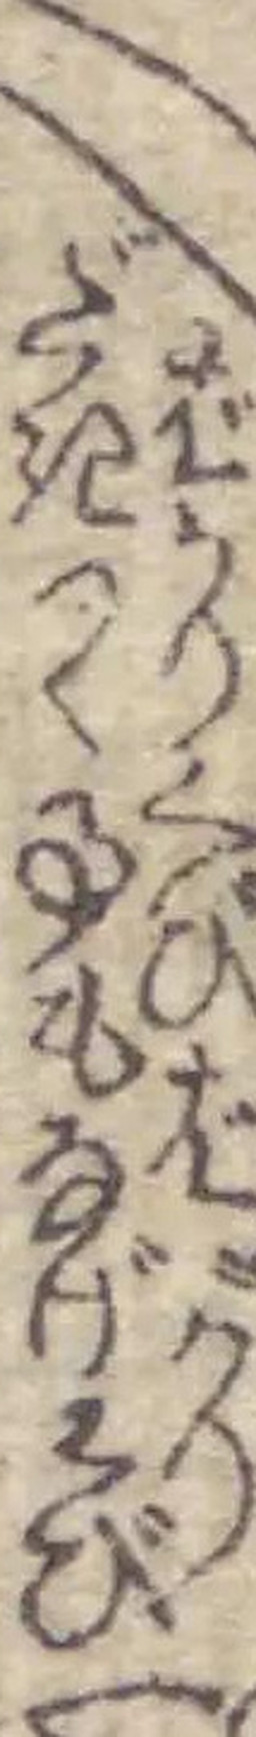だきつく事もなげくび
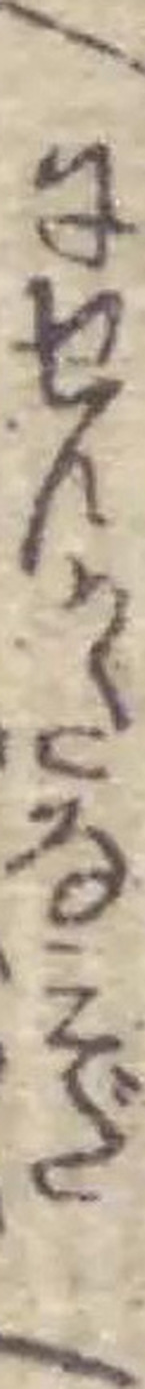にせんかたなみだ
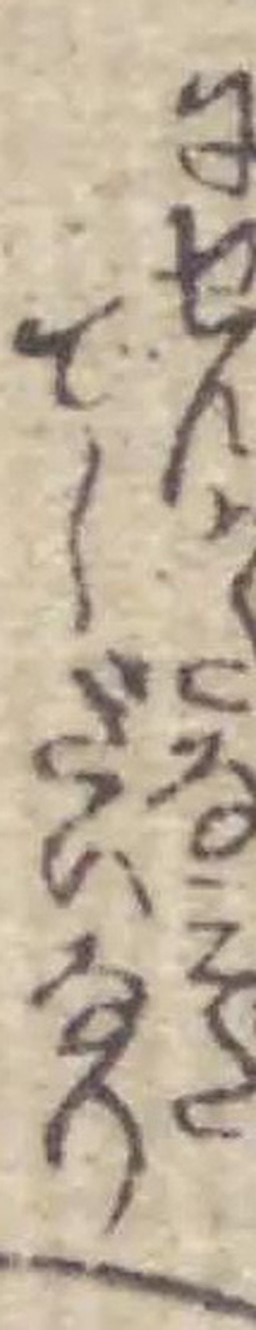でしだいなり

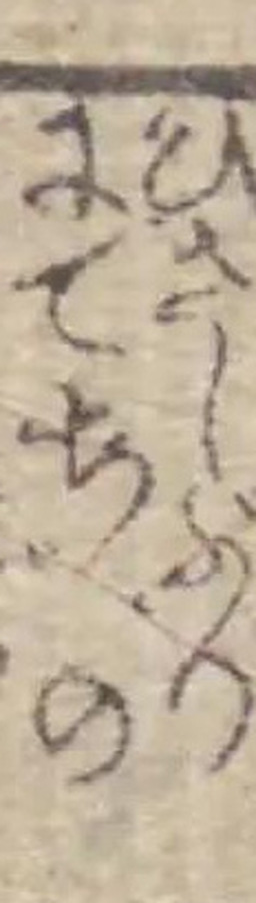にてちゝの
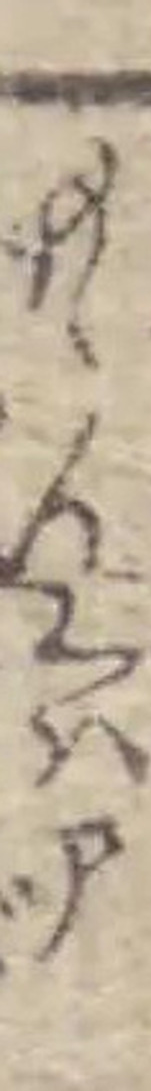もゝんぐはァ
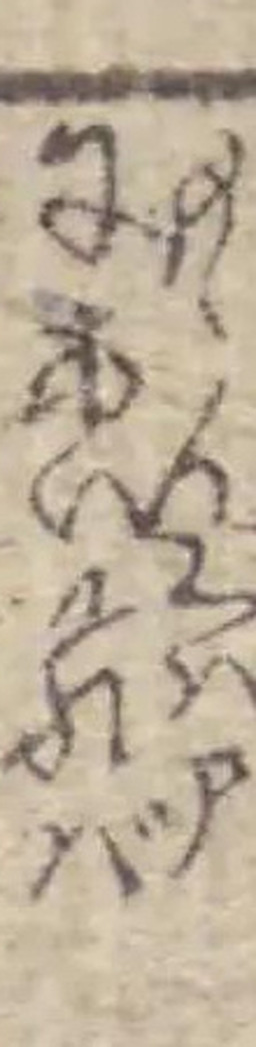にあいければ
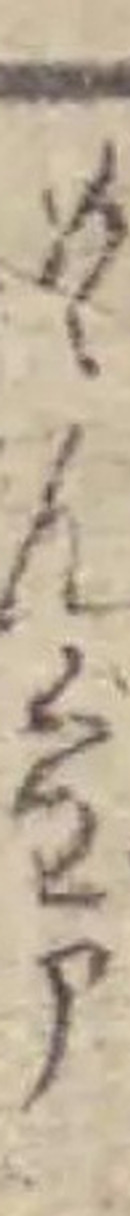もゝんぐわァ
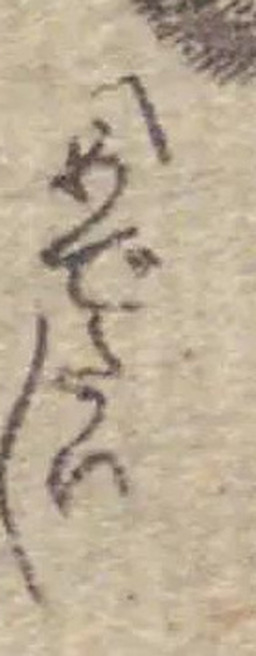〽めでたい
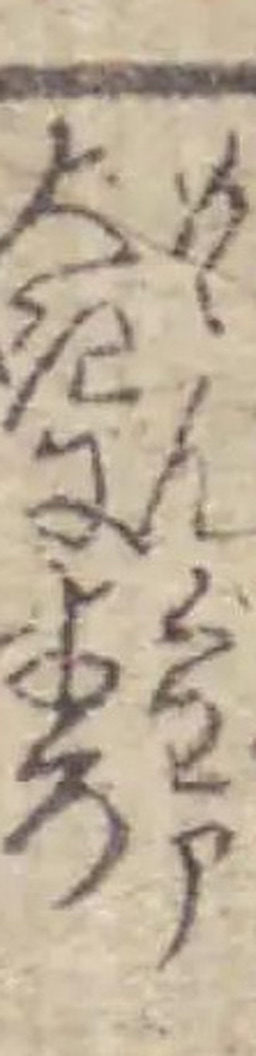大きによろ
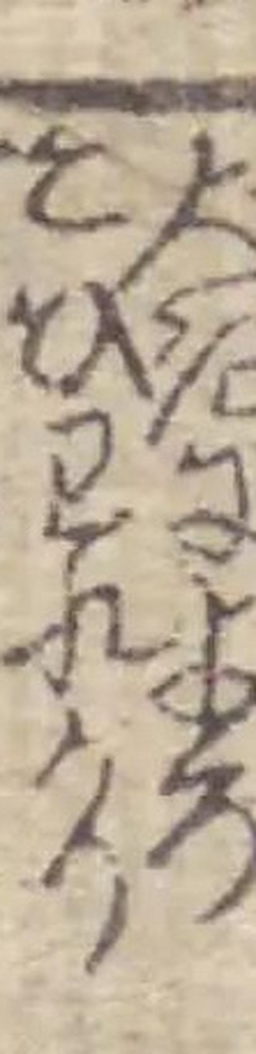こひわれかり
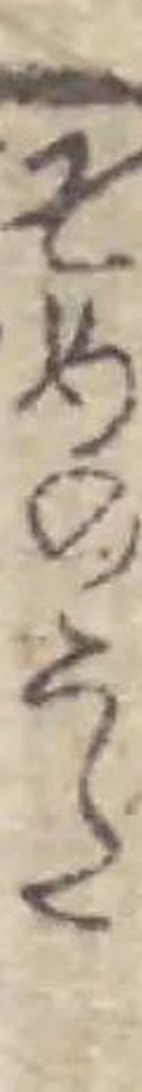そめのうた
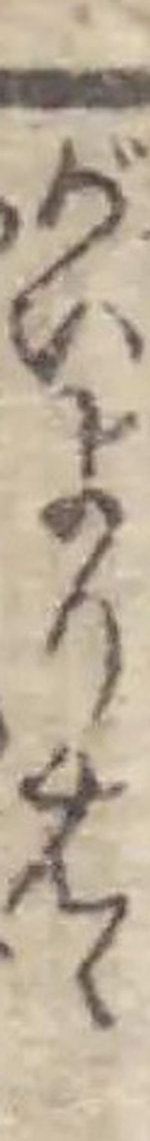がいよりはゝ
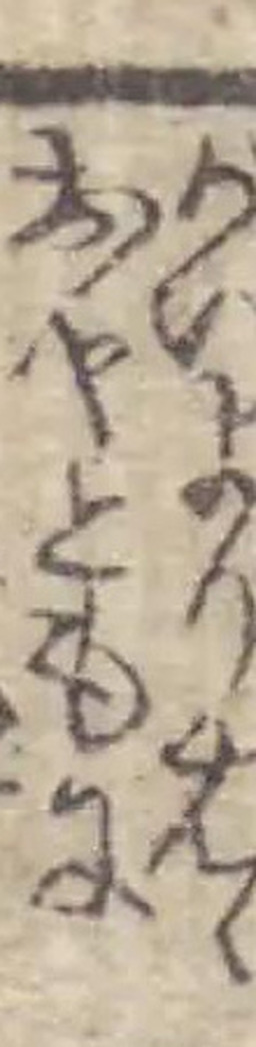おやともに
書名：化物尽 4巻
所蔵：国立国会図書館 National Diet Library, JAPAN
